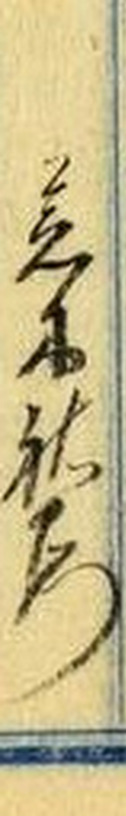荒木祐右衛門
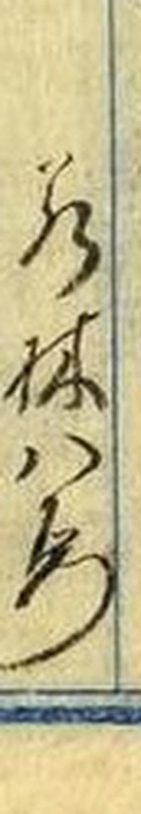若林八右衛門
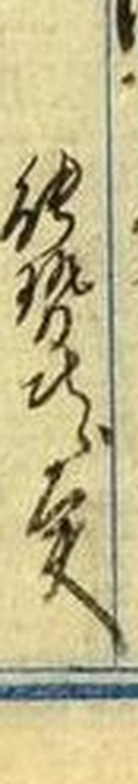能勢次郎太夫
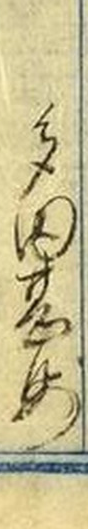多田甚左衛門

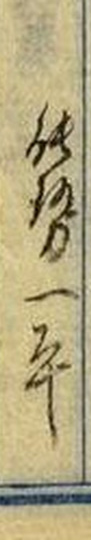能勢一平
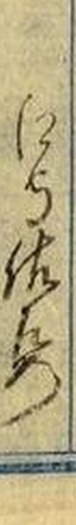江守佐左衛門
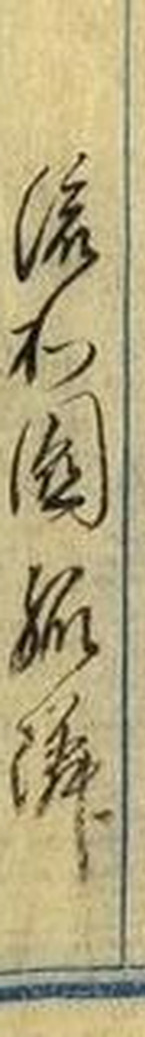流和園孤隣
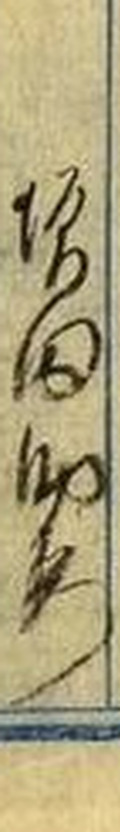増田助右衛門
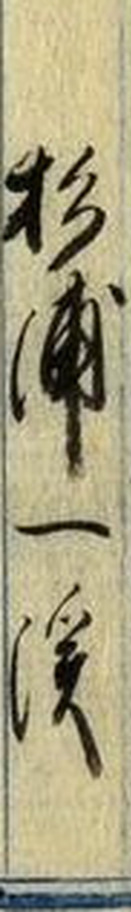杉浦一渓
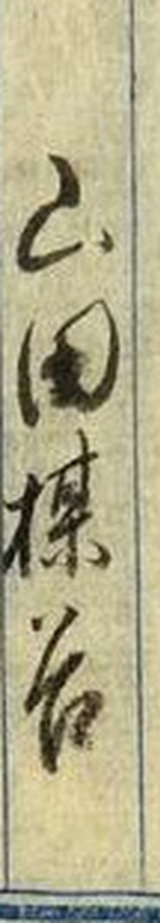山田楳谷

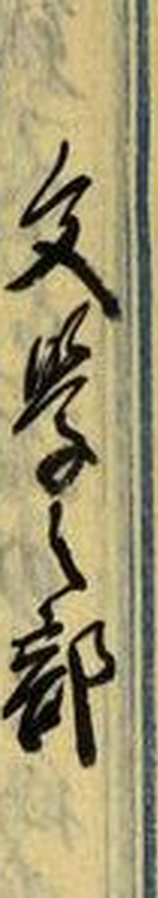文学之部
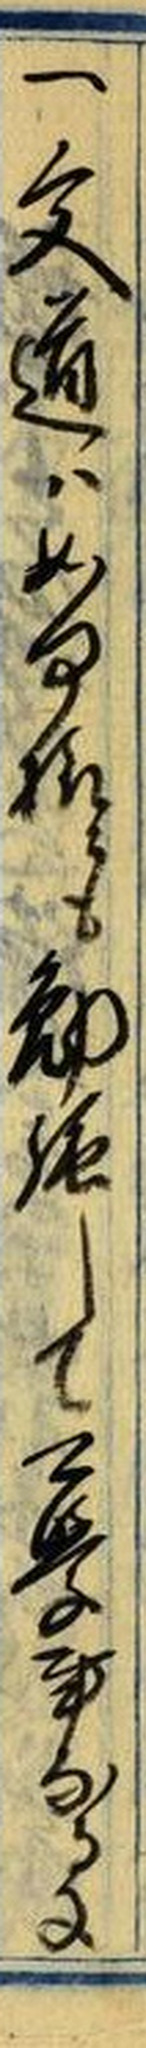一文道は如何様にも勉強して可学事なるに
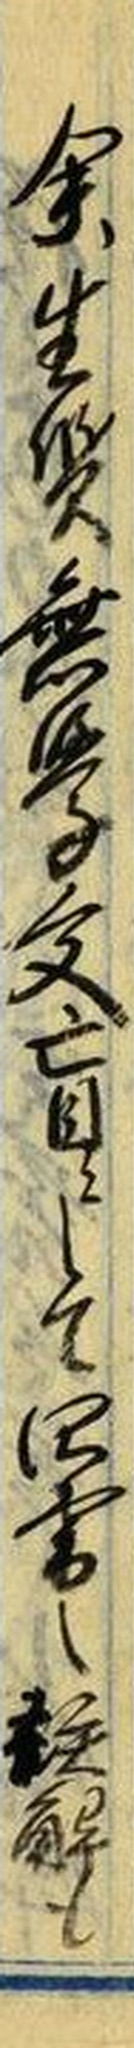余生質無学文盲にして四書之疑解も
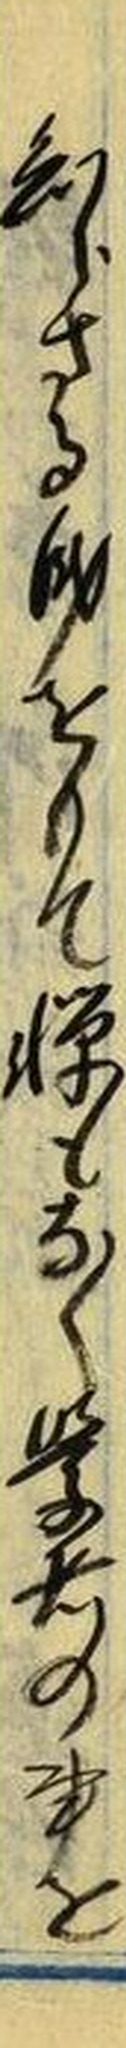知らさる身をもて憚もなく学者の事を
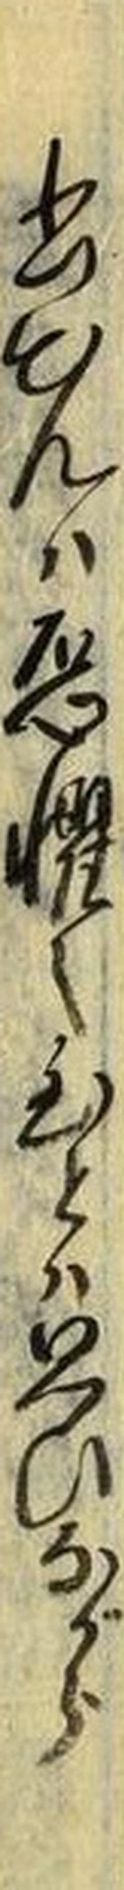書出んは恐懼之至とは思ひながら
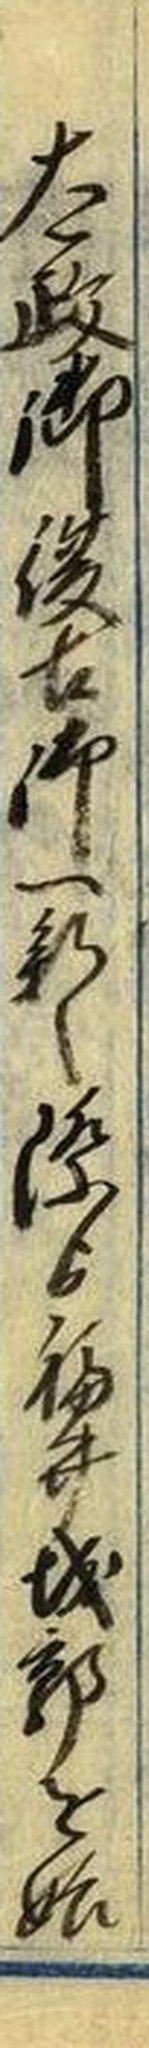太政御復古御一新之際ゟ福井城郭を始
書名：温古集 四巻
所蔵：福井県文書館 Fukui Prefectural Archives
